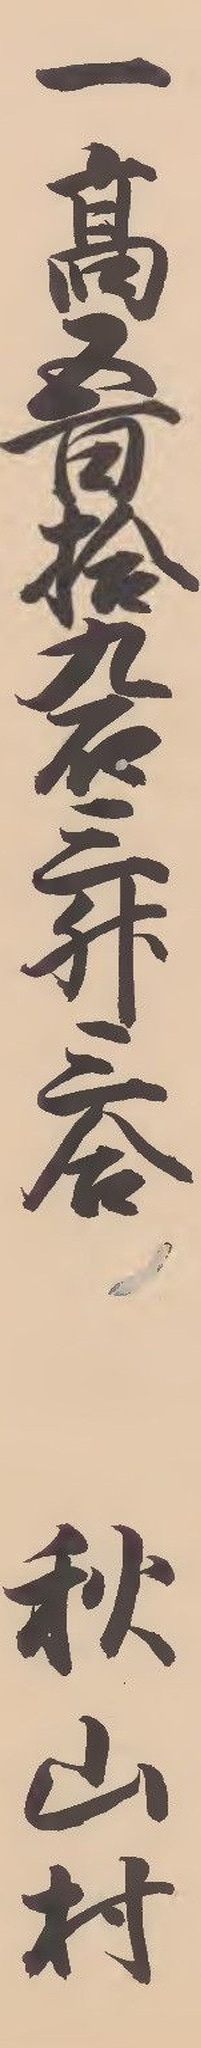一高五百拾九石三升三合秋山村

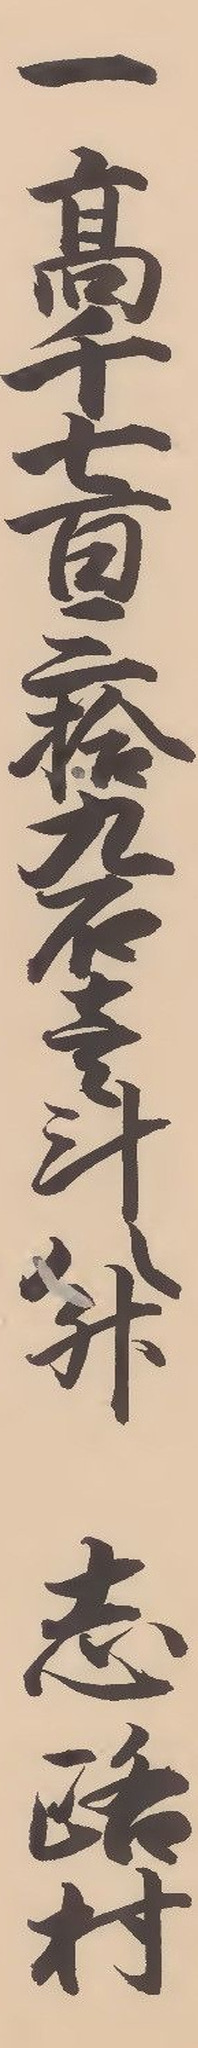一高千七百三拾九石壱斗八升志路村
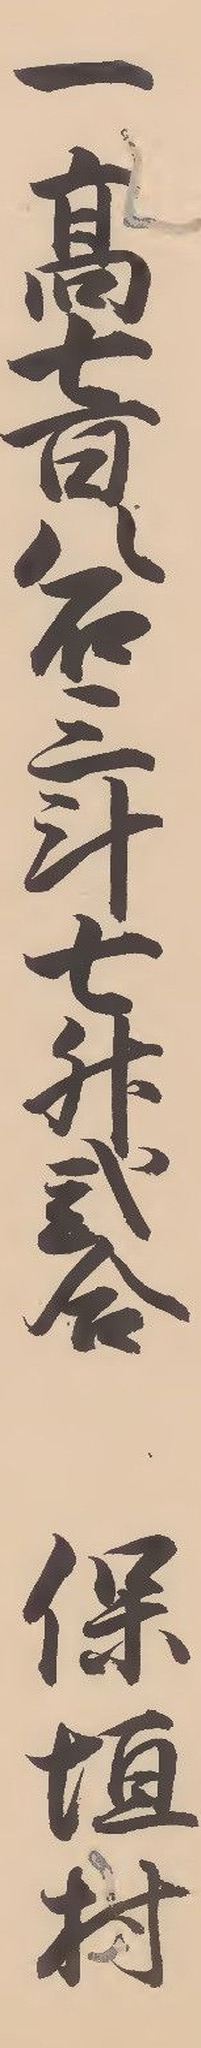一高七百八石三斗七升弐合保垣村
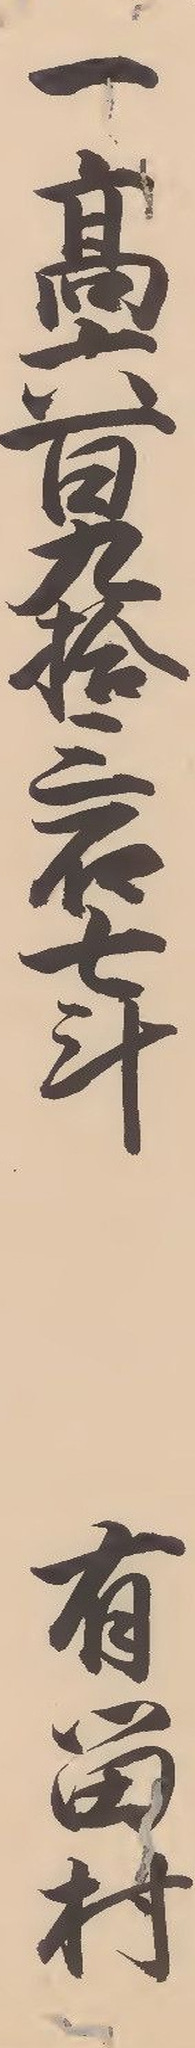一高六百九拾三石七斗有留村
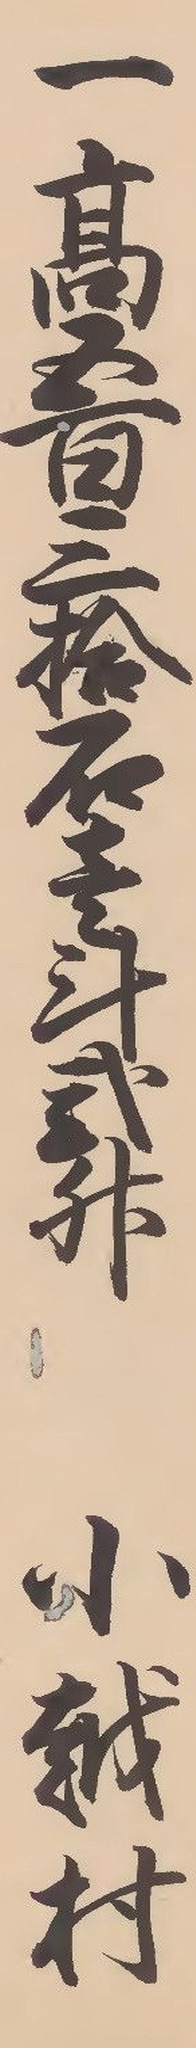一高五百三拾石壱斗弐升小越村
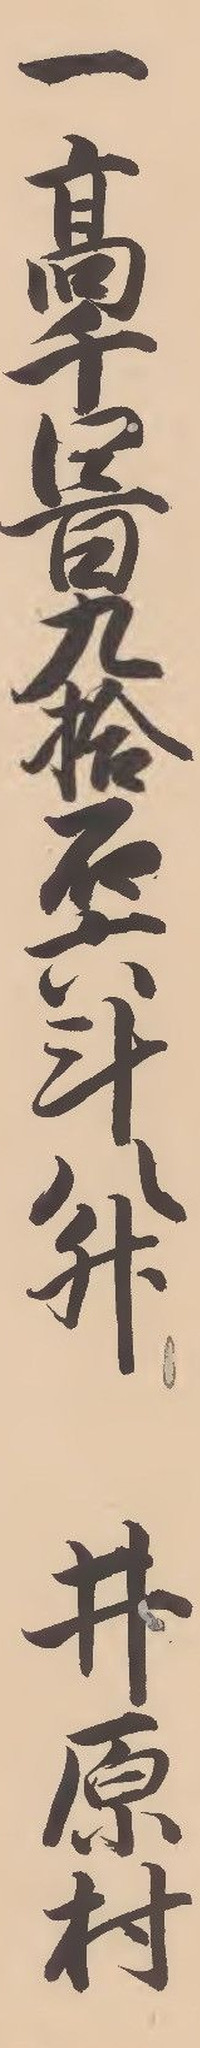一高千四百九拾石六斗八升井原村
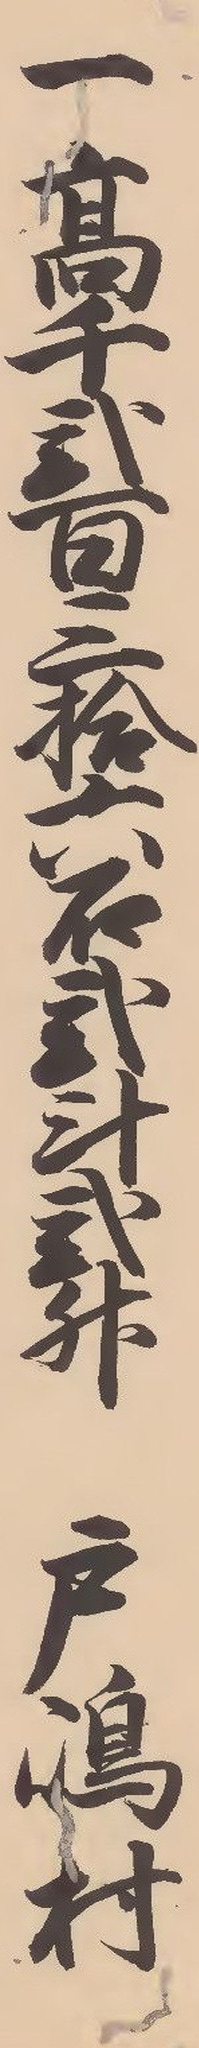一高千弐百三拾六石弐斗弐升戸島村
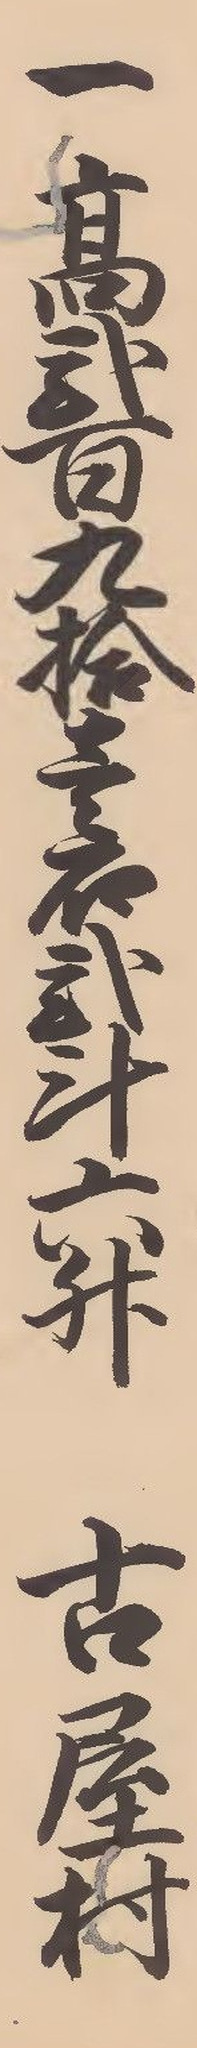一高弐百九拾壱石弐斗六升古屋村
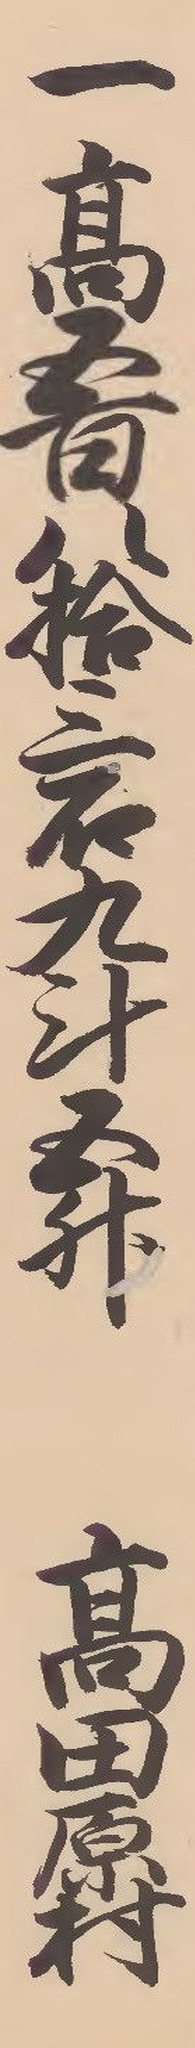一高五百八拾三石九斗五升高田原村

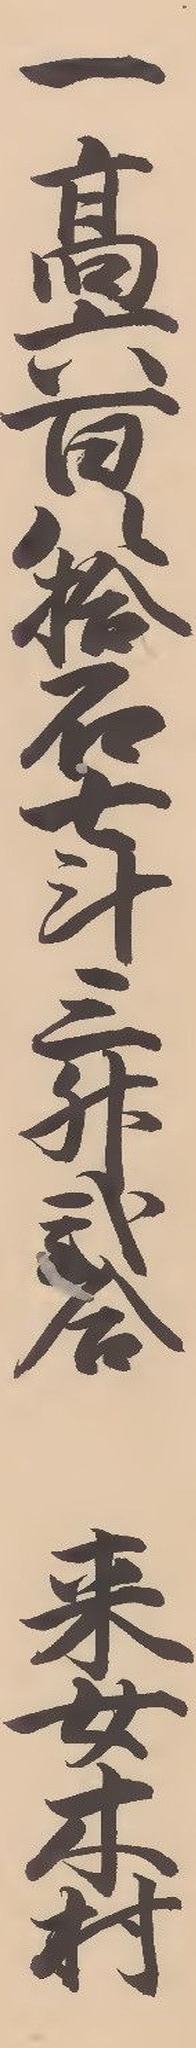一高六百八拾石七斗三升弐合来女木村
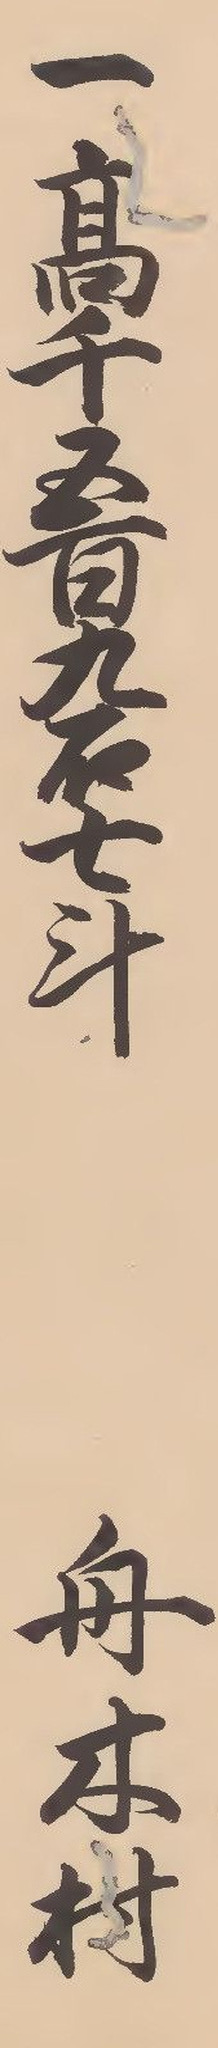一高千五百九石七斗舟木村
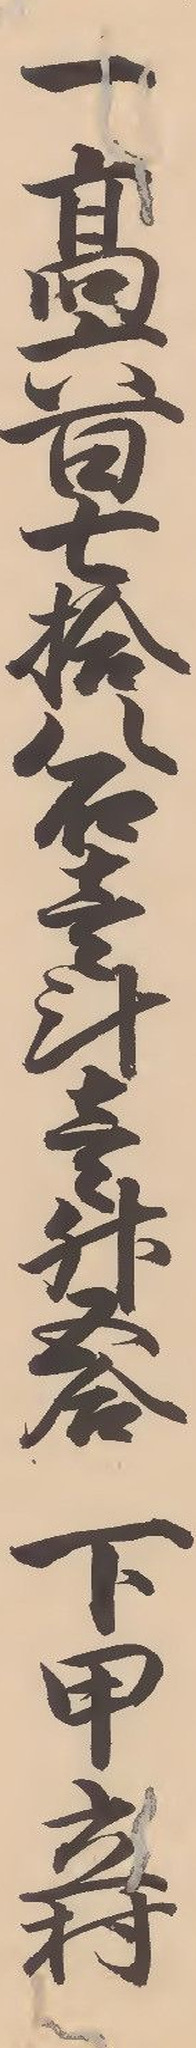一高六百七拾八石壱斗壱升五合下甲立村
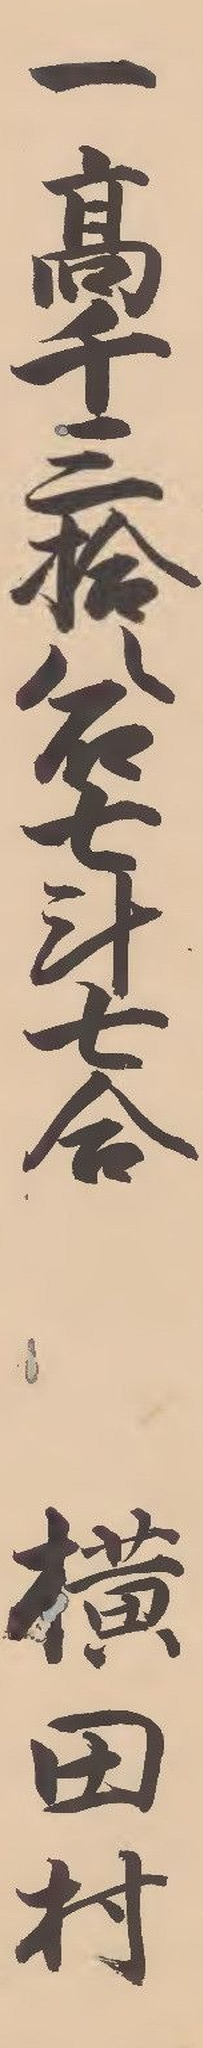一高千三拾八石七斗七合横田村
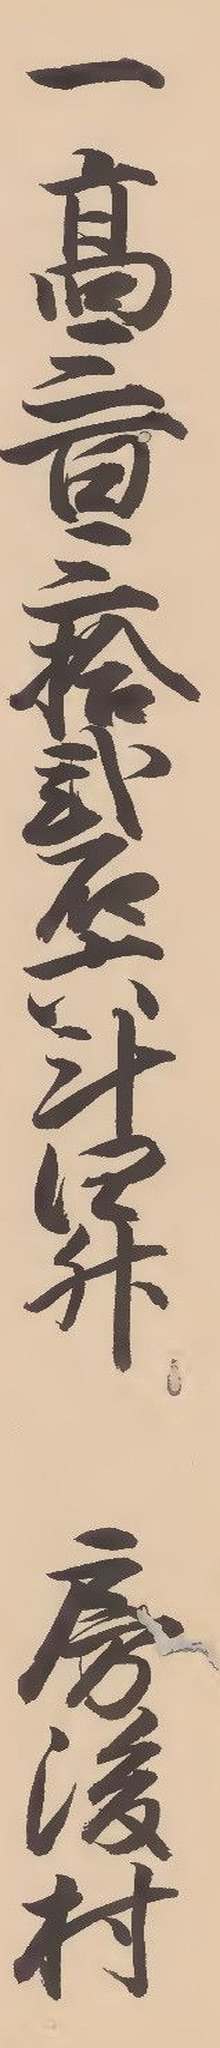一高三百三拾弐石六斗四升房後村
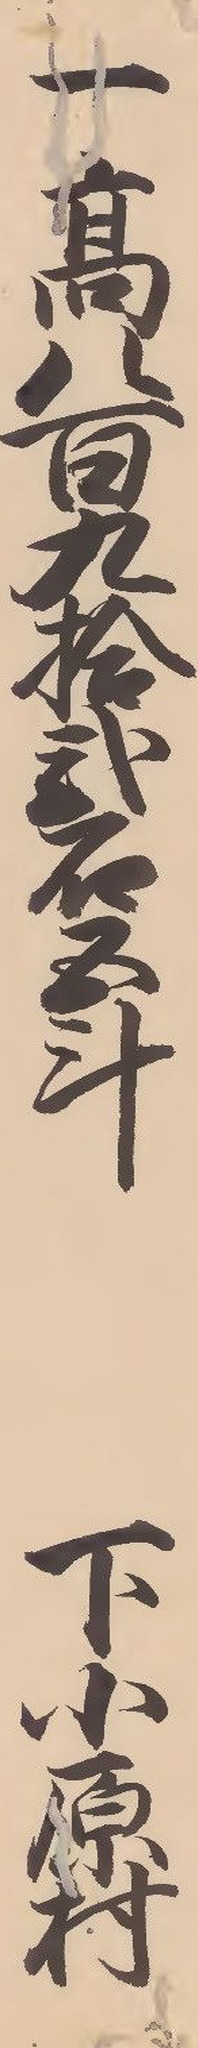一高八百九拾弐石五斗下小原村
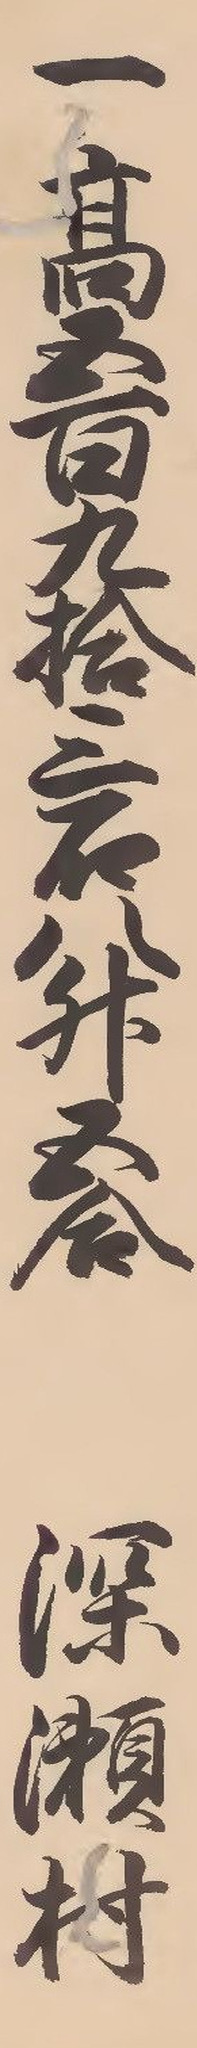一高五百九拾三石八斗五合深瀬村
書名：安芸国郷帳
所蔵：国立公文書館 National Archives of Japan
